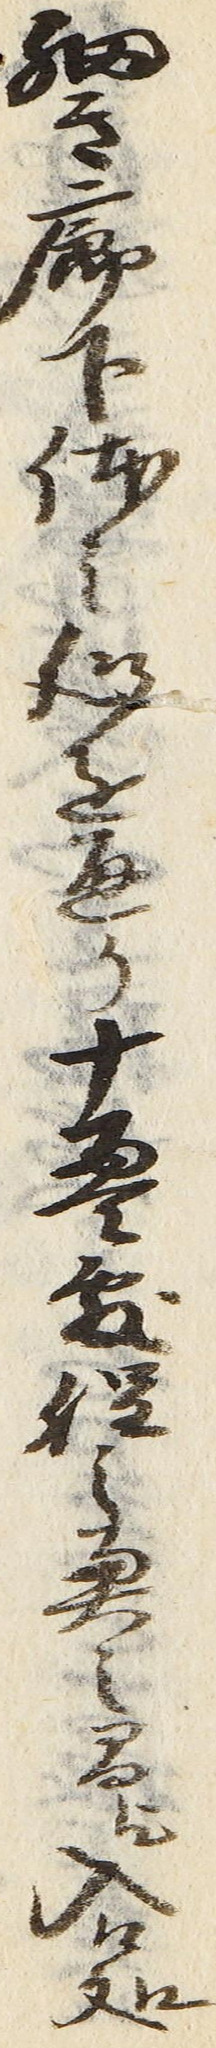細き廊下体之処を通り十畳敷程之奥之間江入候処
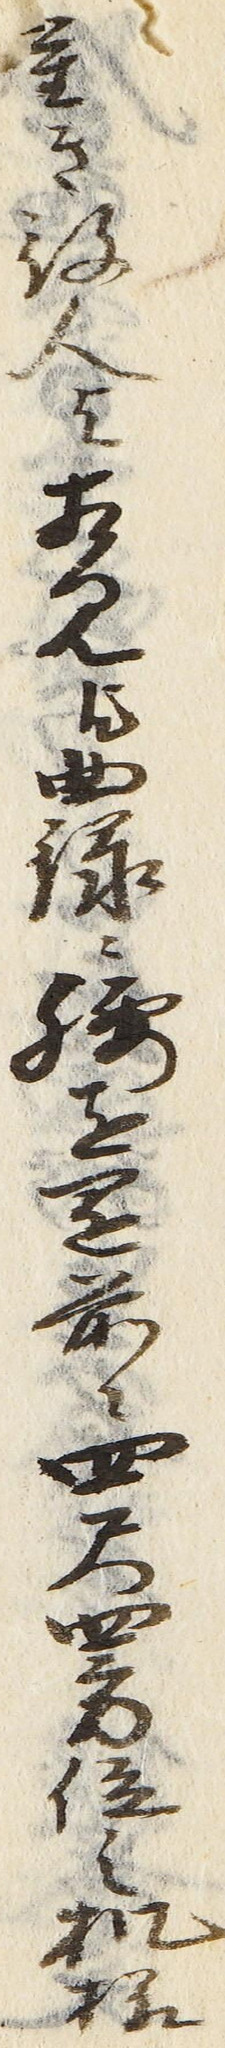重き役人と相見江曲禄二腰を置前ニ四尺四方位之机様
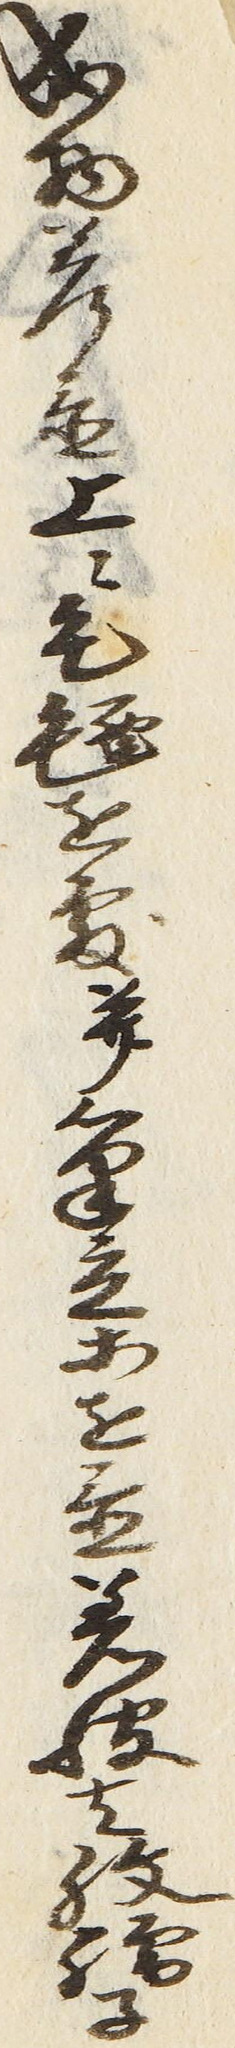成物差置上ニ毛氊を敷幷筆立等を置着服者紋繻子
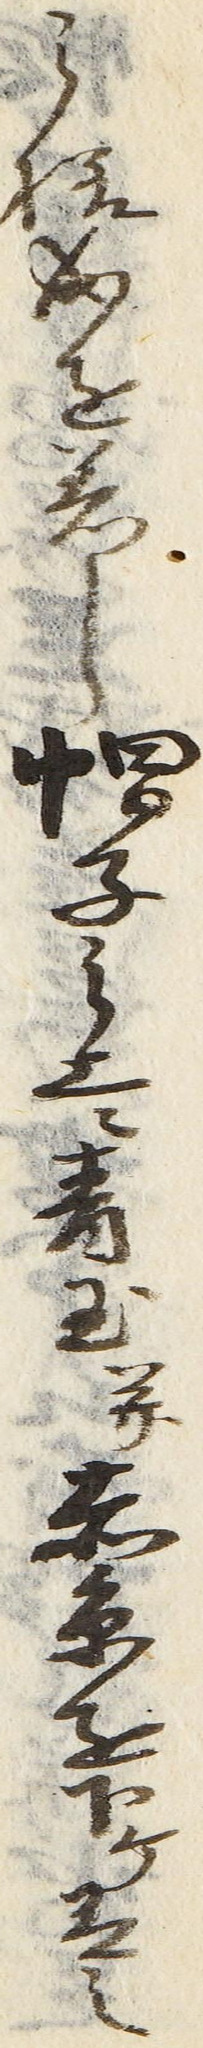之様成を着し帽子之上ニ青玉幷赤糸を下ケ有之
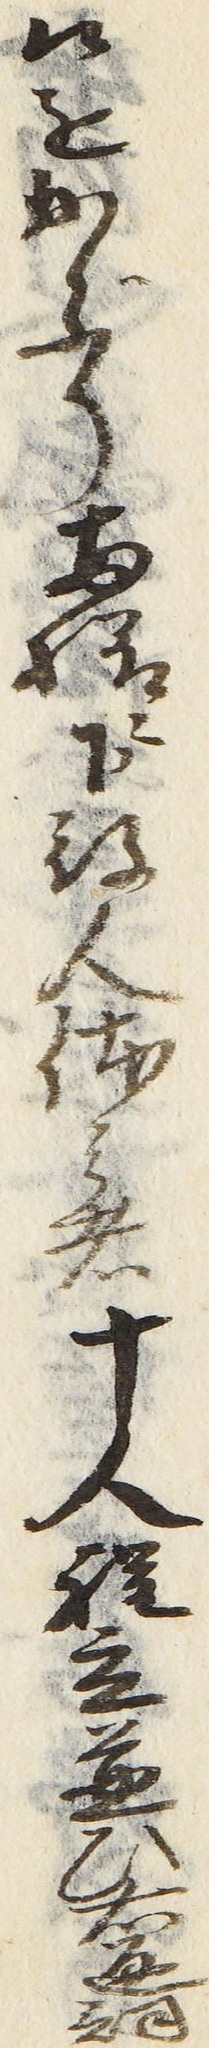候をかぶり両様ニ下役人体之者十人程立並ひ右通詞
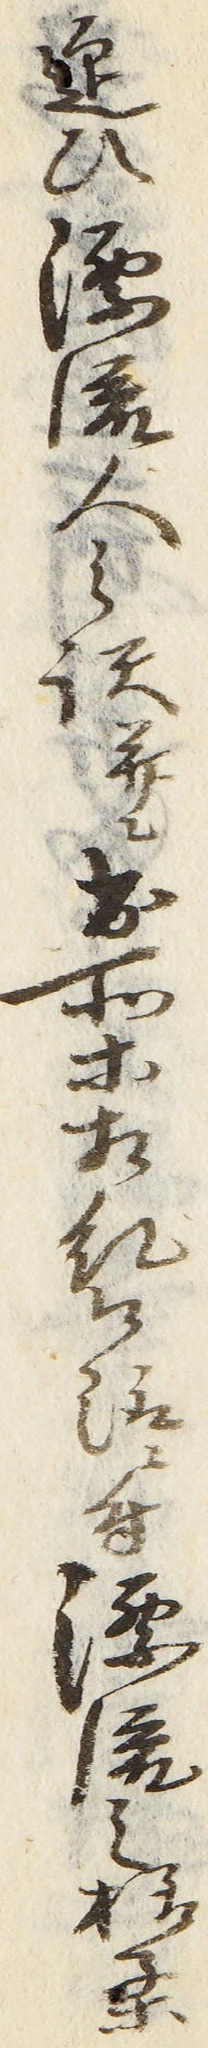迎ひ漂流人之訳幷ニ出所等相糺候趣ニ付漂流之様子等
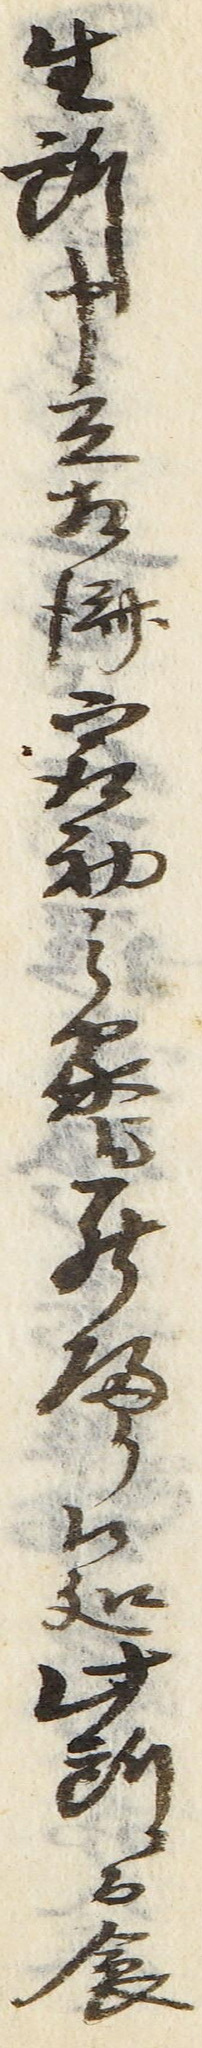生所申立相濟最初之家江罷帰り候処此所ニ而食

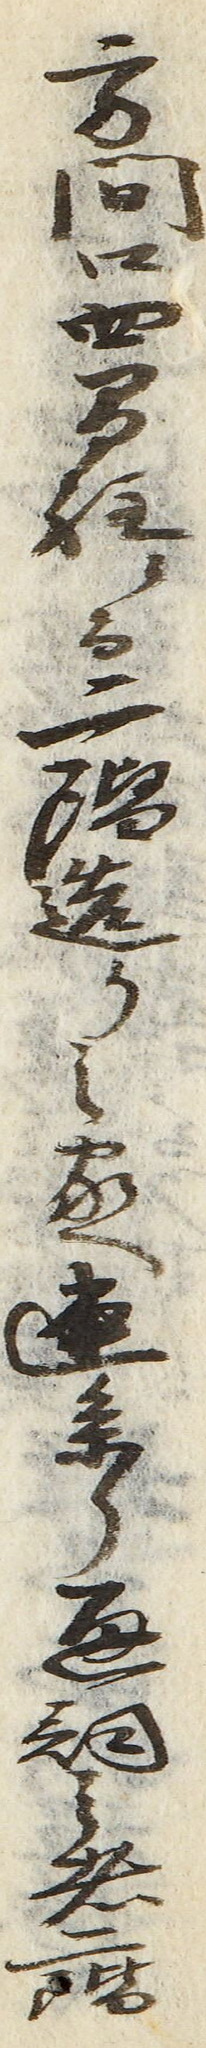方間口四間程ニ而二階造り之家へ連参り通詞之者二階
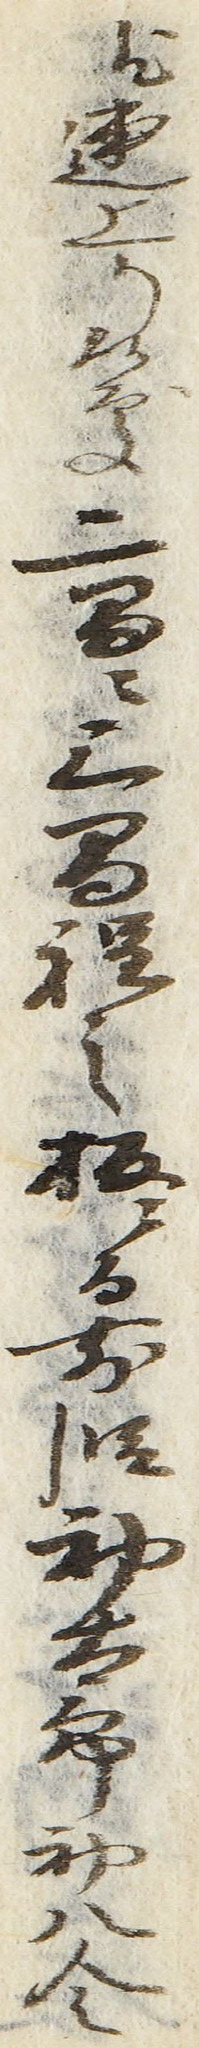江連上り候處二間ニ三間程之板ニ而前段初太郎初八人之
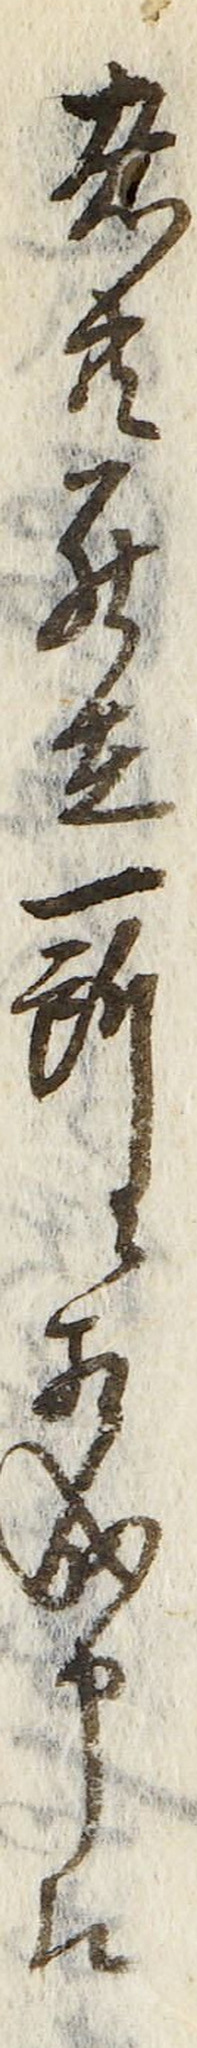者共罷在一所ニ相成申候
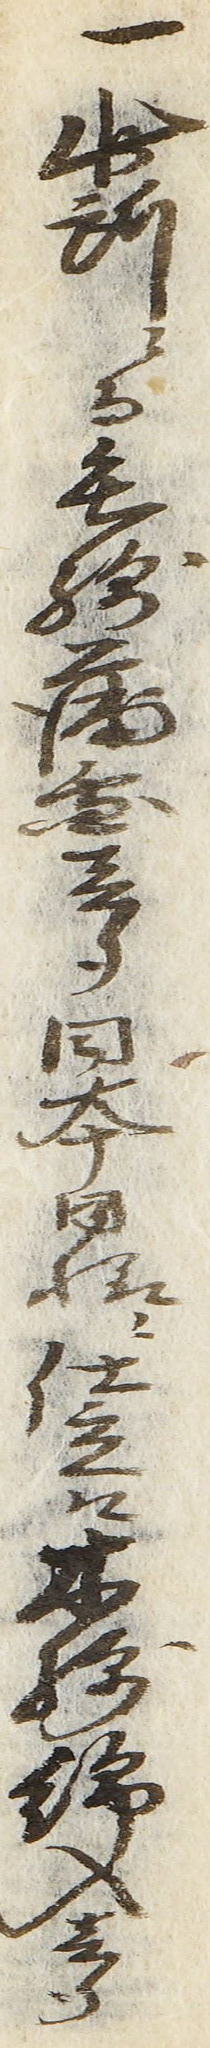一此所ニ而毛綿蒲團壱ツ日本同様ノ仕立候木綿綿入壱ツ
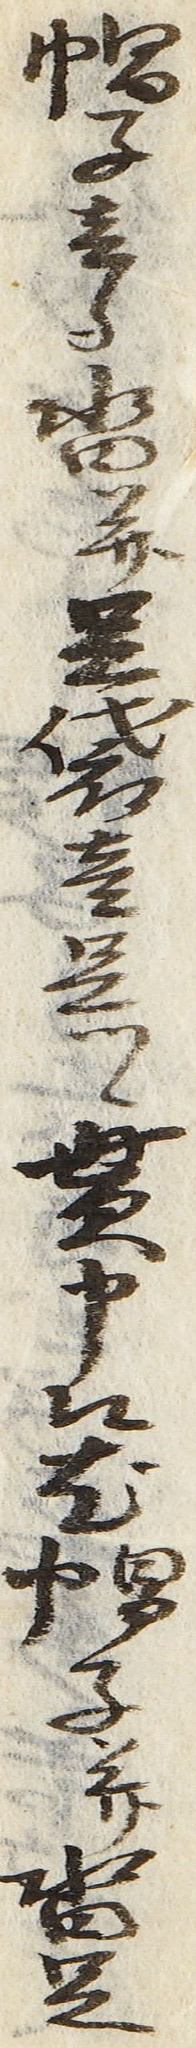帽子壱ツ沓幷足袋壱足ツヽ貰申候尤帽子沓足
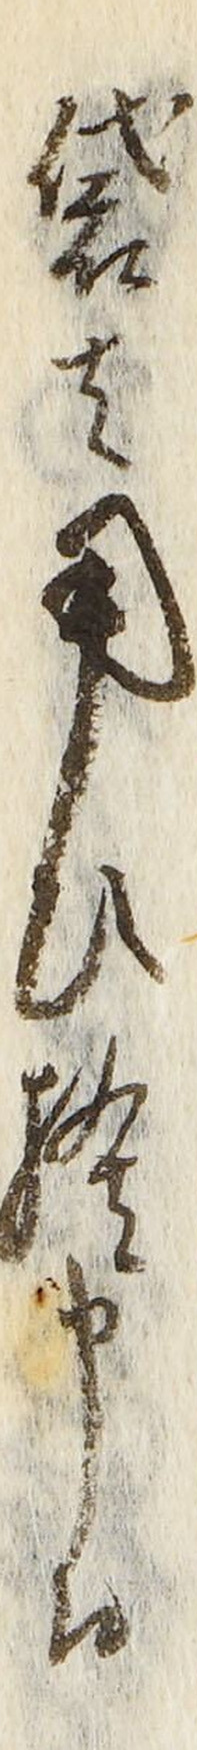袋者用ひ捨申候
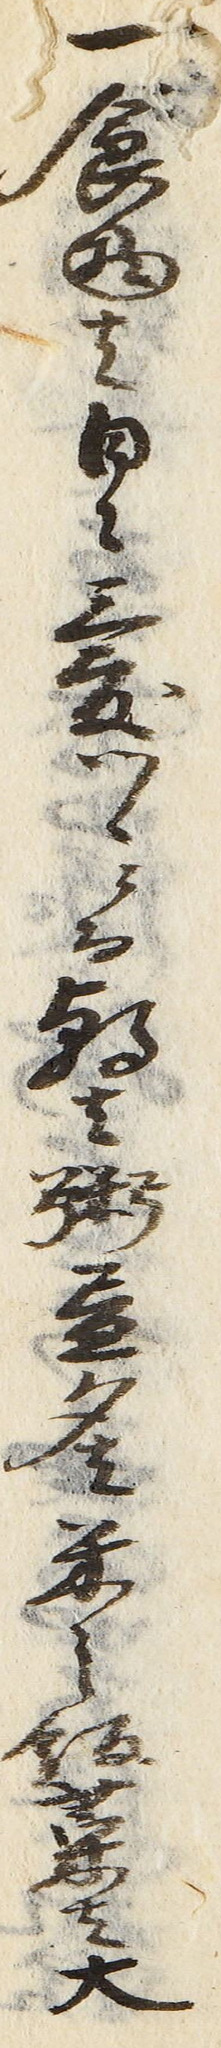一食物者日々三度ツヽニ而朝者粥晝夕者米之飯菜者大
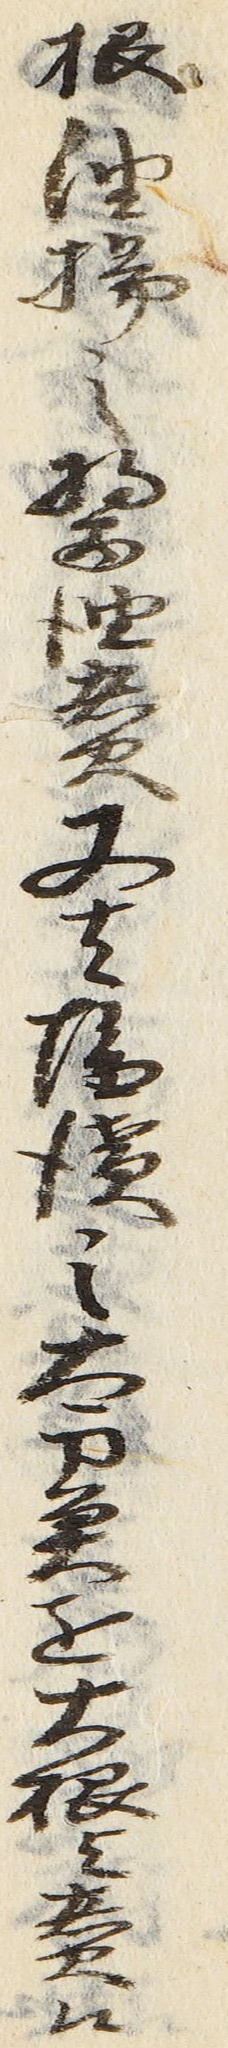根油揚之醤油煑又者塩漬之太刀𩵋を大根と煑候
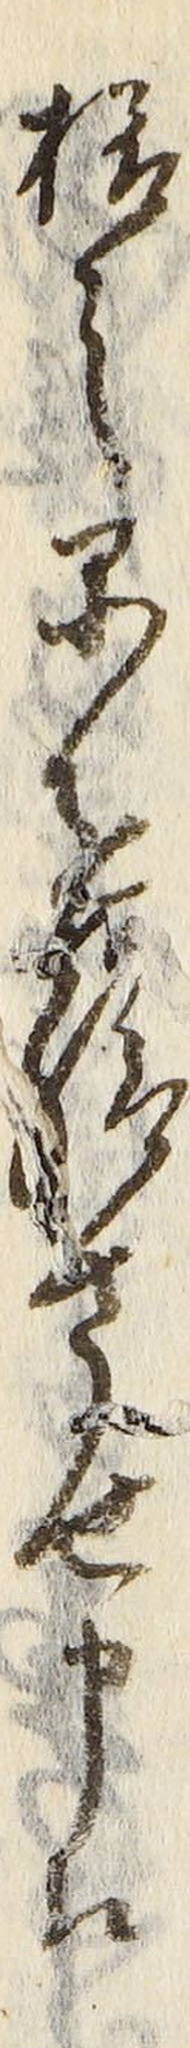様之品を給させ申候
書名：漂流人善助聞書
